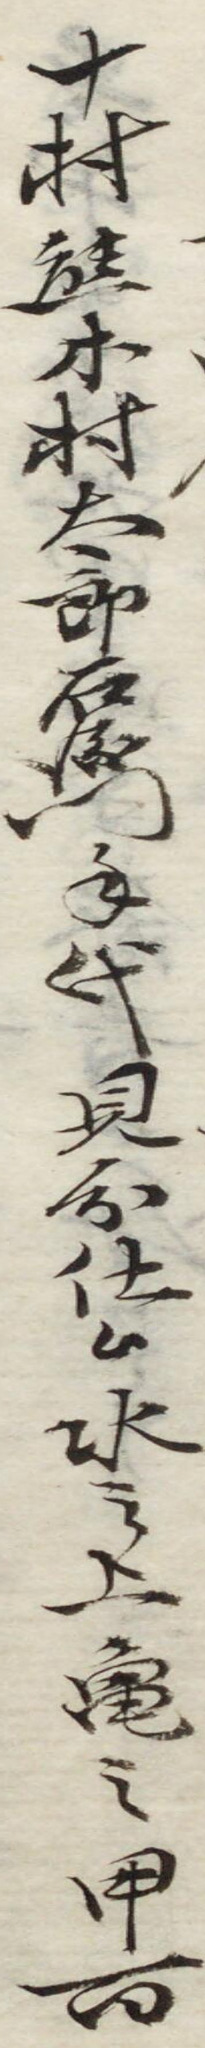十村熊木村太郎右衛門手代見分仕候水之上亀之甲百
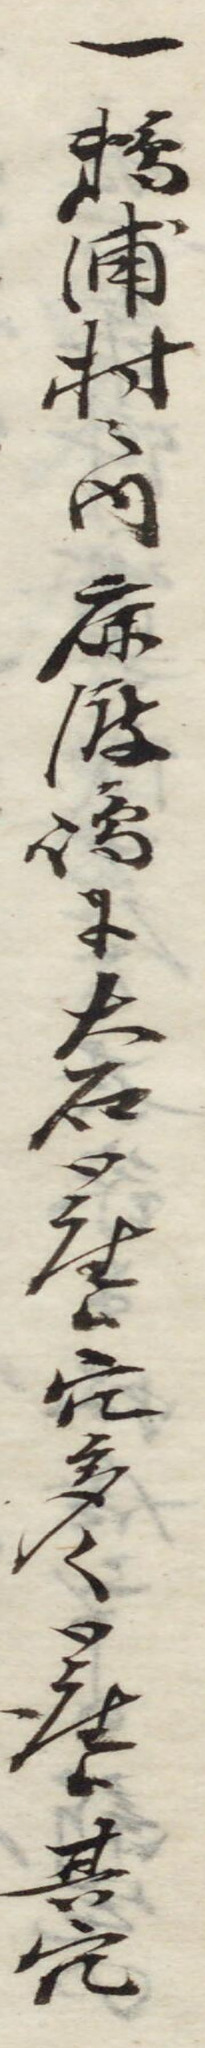一鵜浦村之内鹿波嶋に大石御座候穴多く御座候其穴
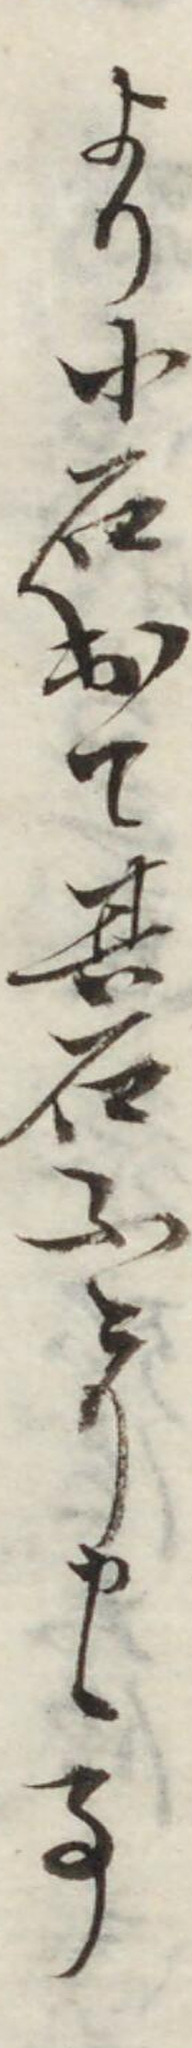より小石出て其石ふとり申候事
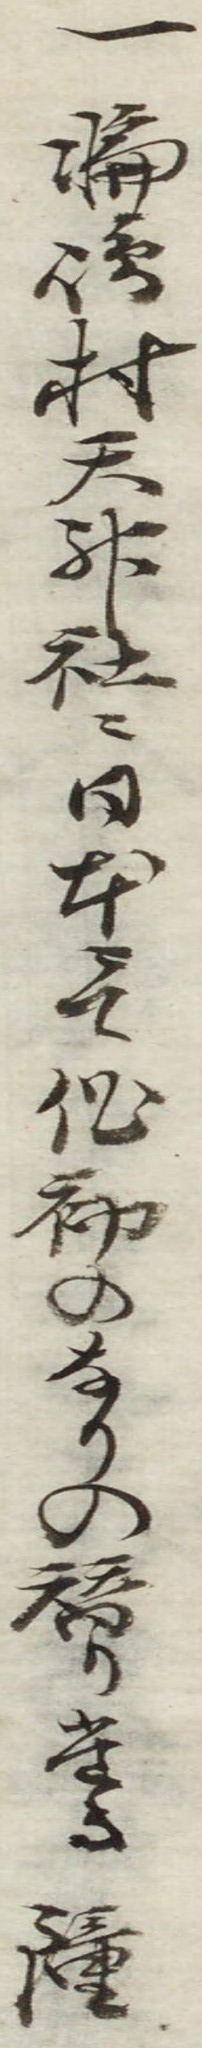一輪嶋村天神社に日本にて作初のなりの替りたる鐘
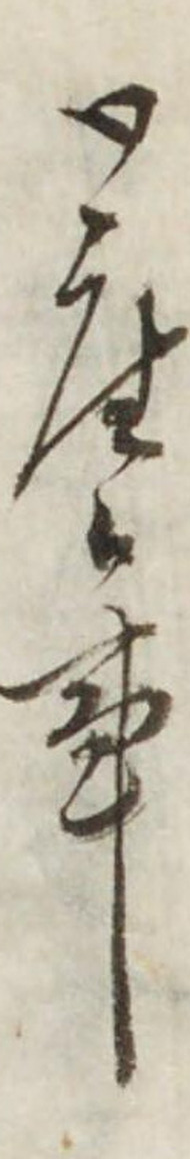御座候事
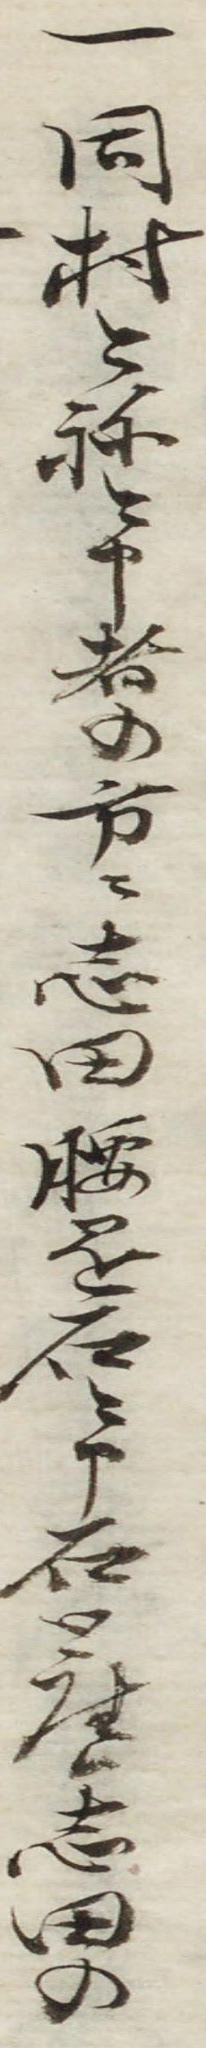一同村と祢と申者の方に志田こしかけ腰懸石と申石御座候志田の
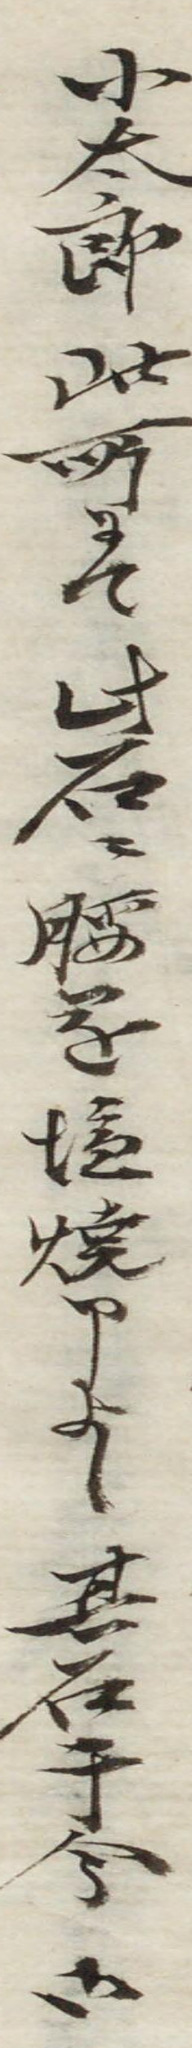小太郎此所にて此石に腰懸塩焼申よし其石于今御
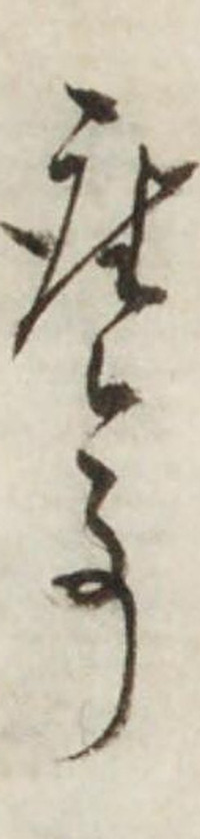座候事
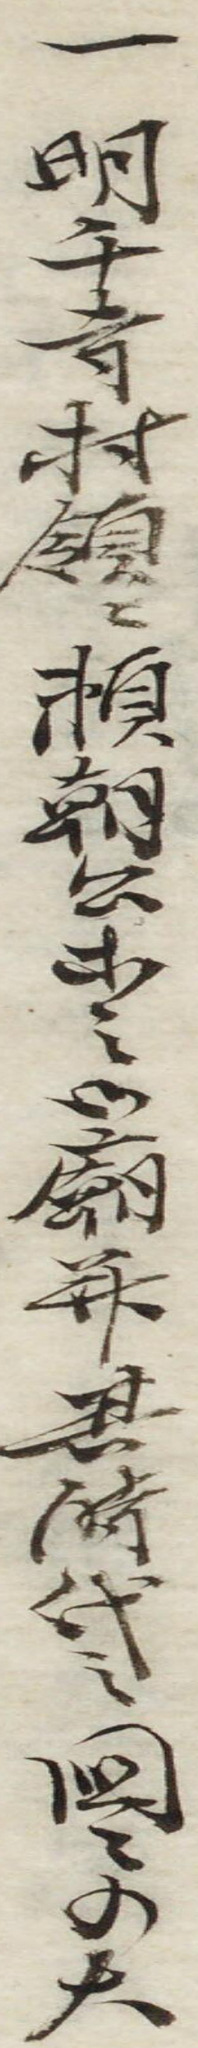一明千寺村領に頼朝公等之御廟并其時代之国々の大
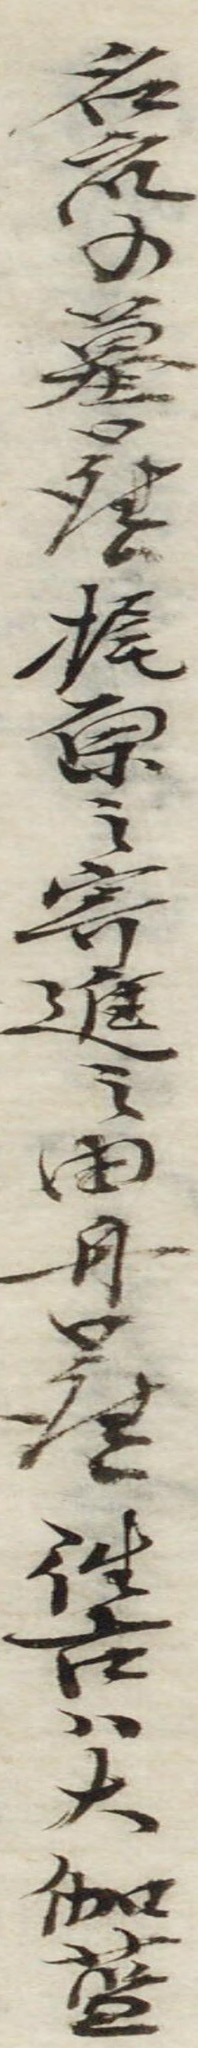名衆の墓御座候梶原之寄進之由舟御座候往古は大伽藍
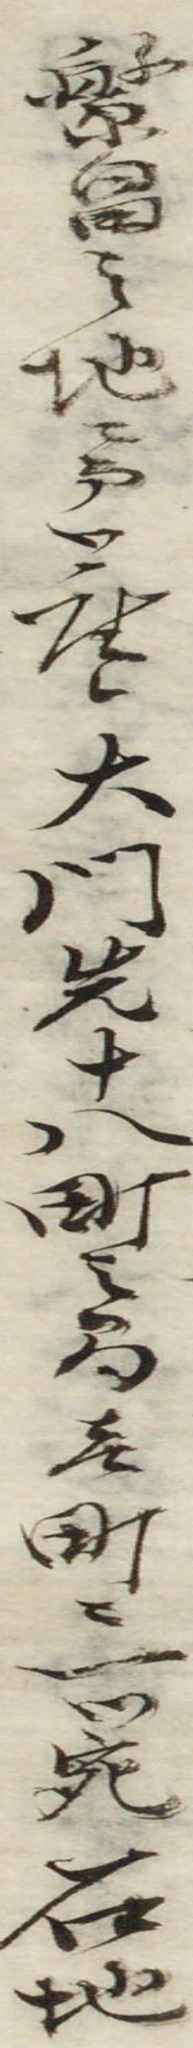繫昌之地に而御座候大門先十八町之間壱町に一ッ宛石地
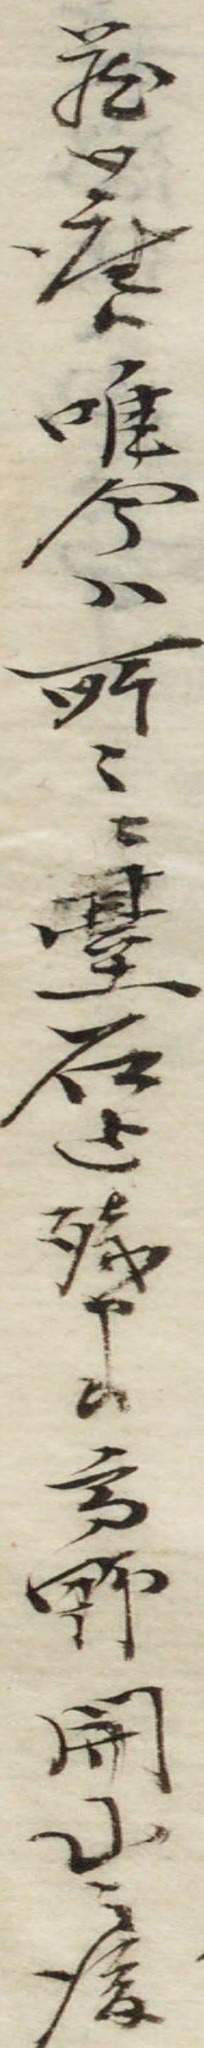蔵御座候唯今は所々に台石迄残申候高野開山之後

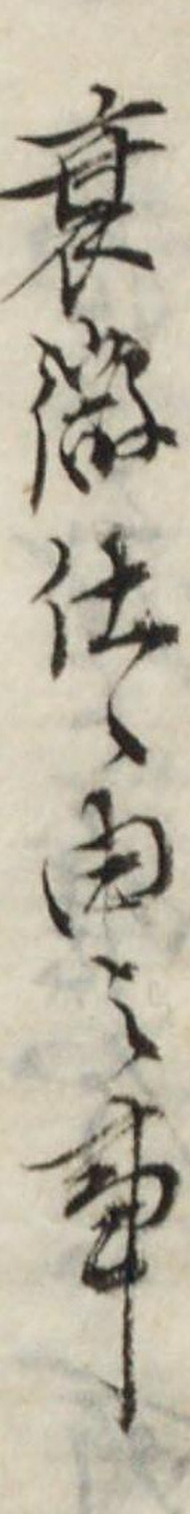衰微仕候由之事
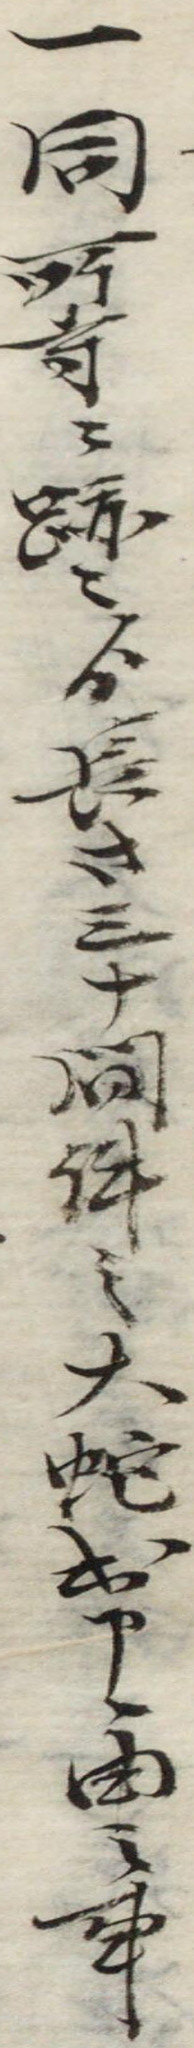一同所寺々跡々ゟ長き三十間許之大蛇出申候由之事
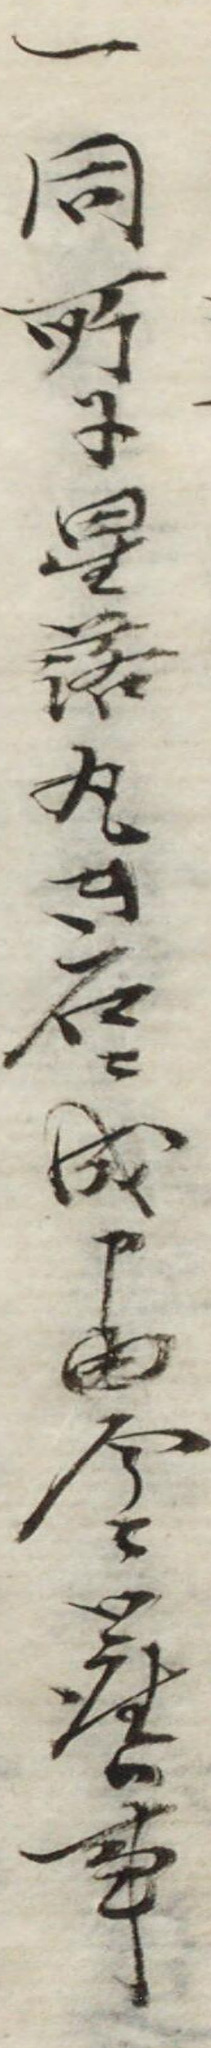一同所に星落丸き石に成申由今に御座候事
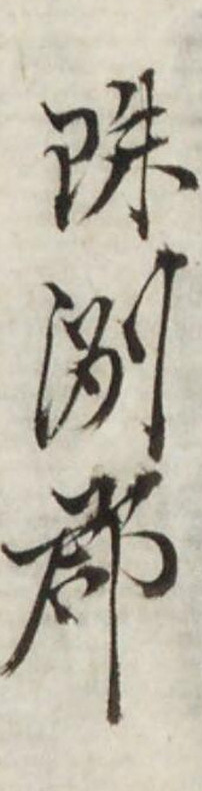珠洲郡
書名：古老旧聞紀略
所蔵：Ishikawa Prefectural Library
